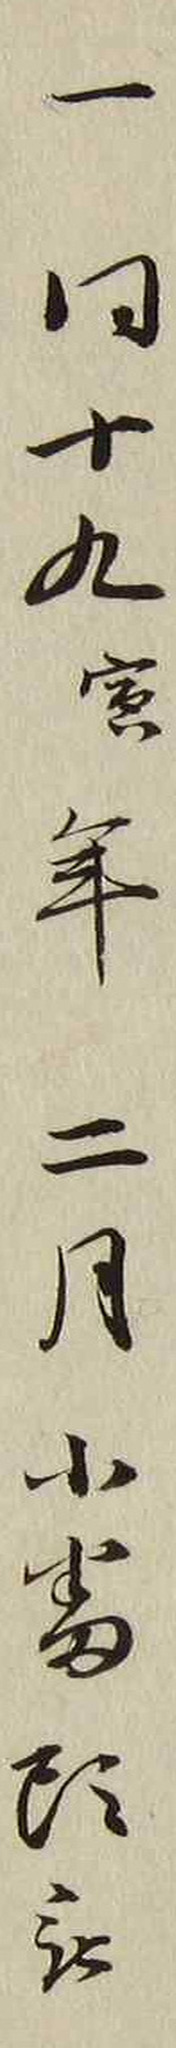一同十九寅年二月小番頭

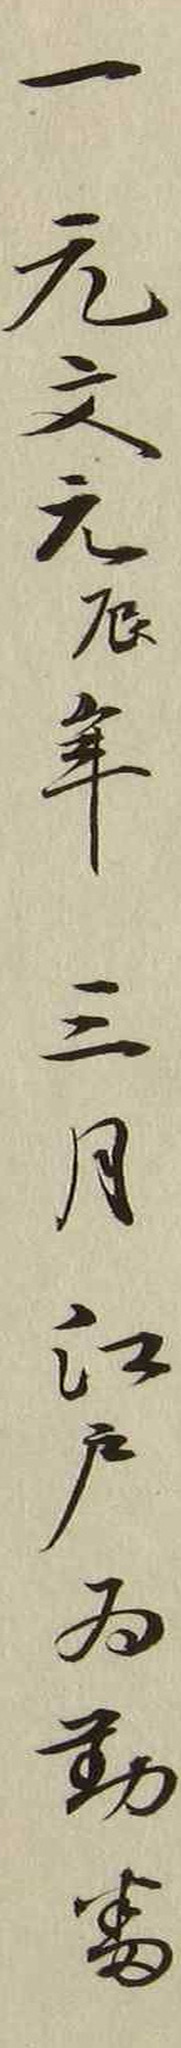一元文元辰年三月え江戸勤番之為
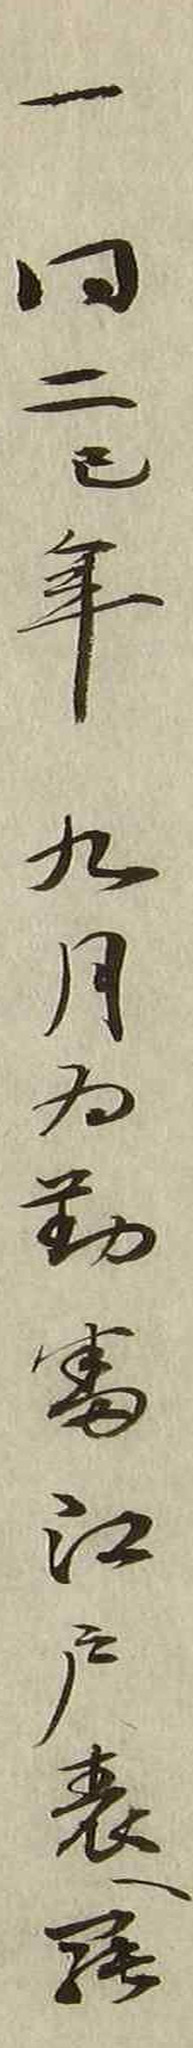一同二巳年九月勤番之為江戸表へ罷り
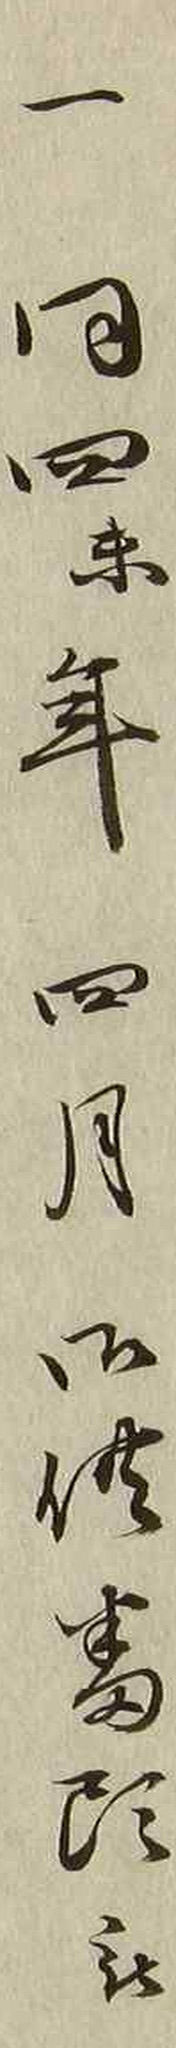一同四未年四月御供番頭
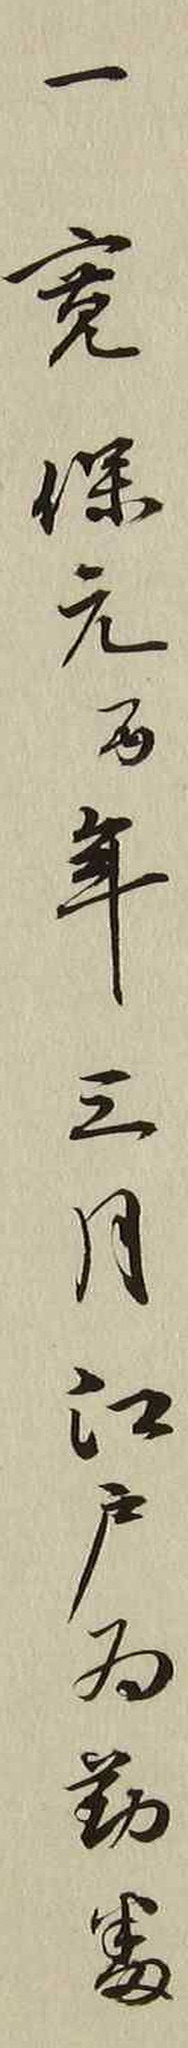一寛保元酉年三月江戸勤番之為
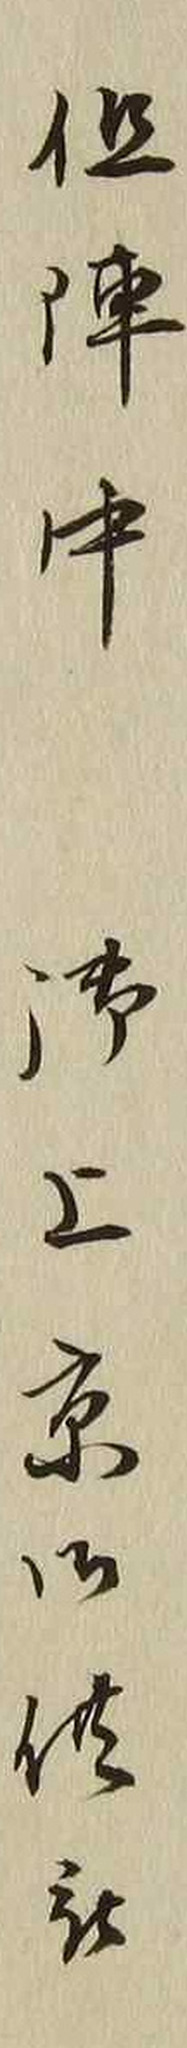但し陣中御上京御供
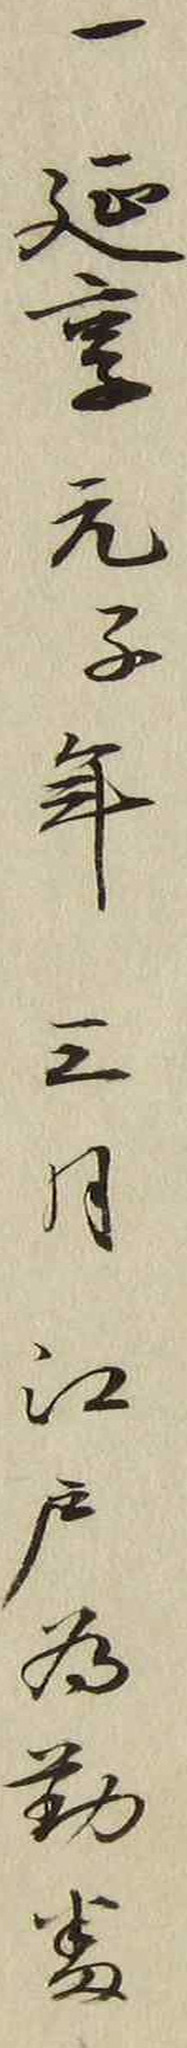一延享元子年三月江戸勤番之為

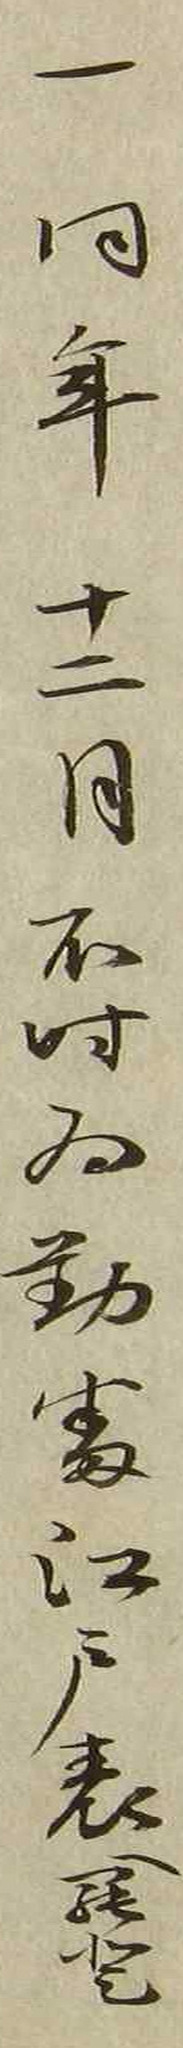一同年十二月不時勤番之為江戸表へ罷り登り
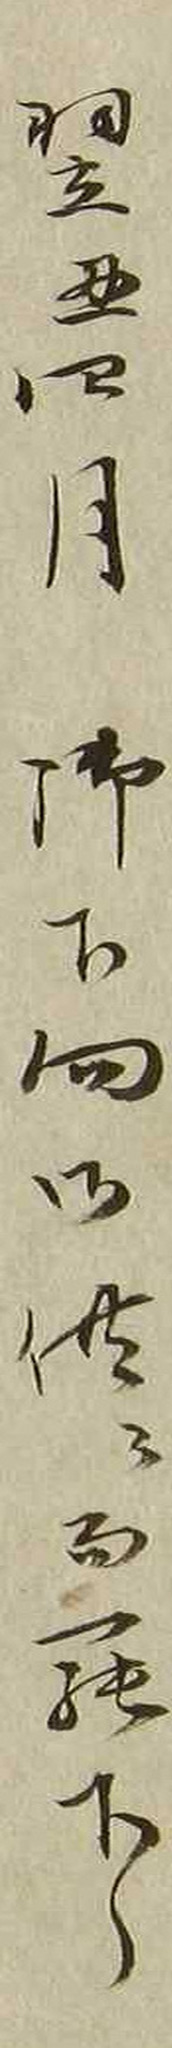翌丑四月御下向御供ニて罷り下り候
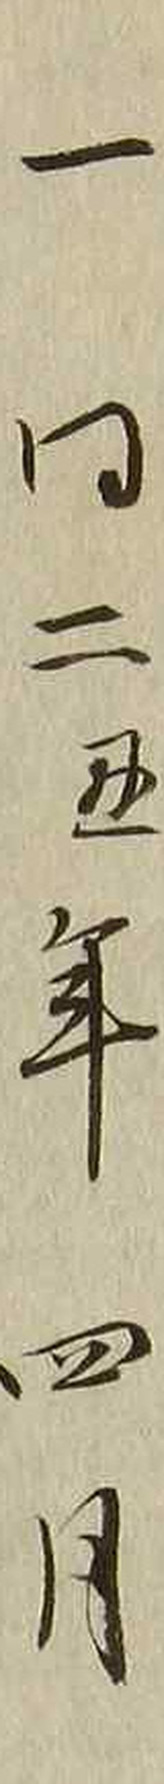一同二丑年四月
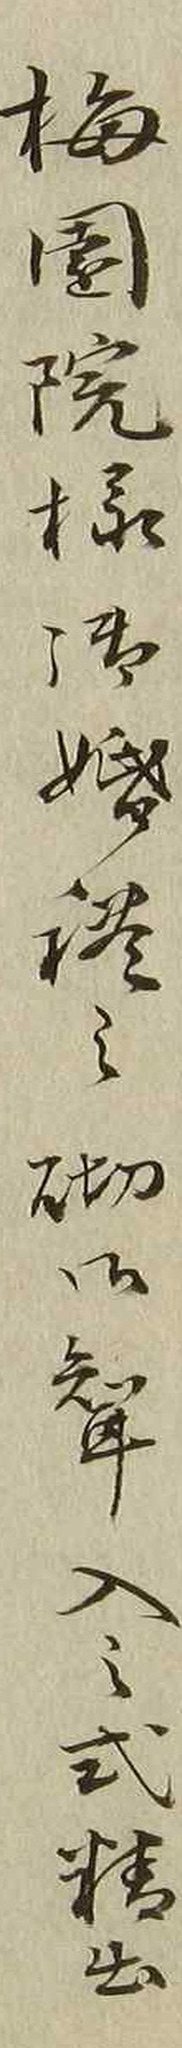梅園院様御婚礼之砌御婿入り之式精出し
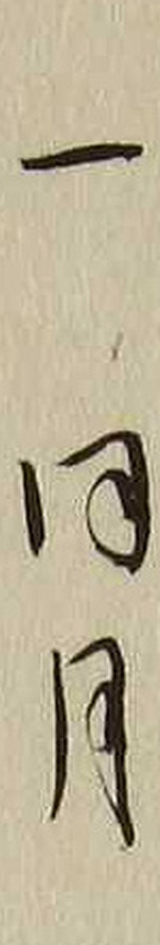一同月
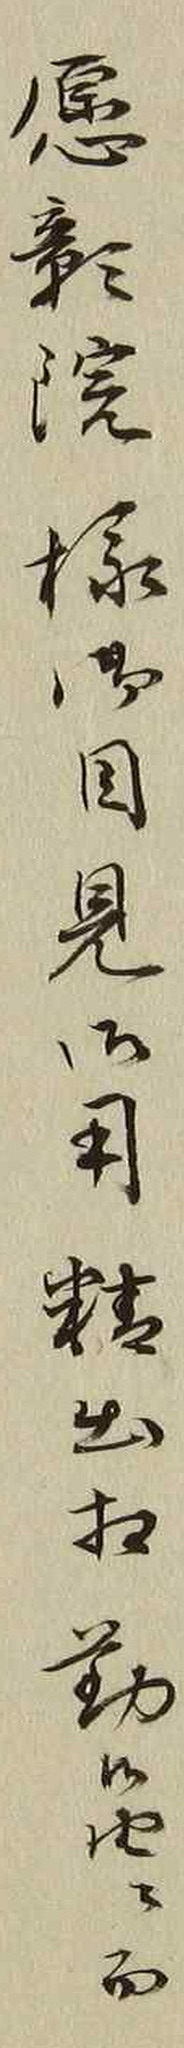愿彰院様御目見御用精出し相勤め候由ニて
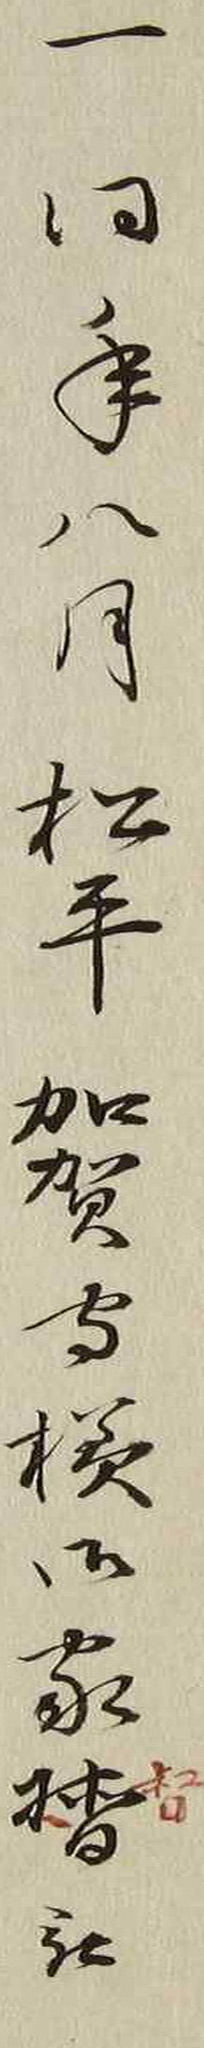一同年八月松平加賀守様御家督
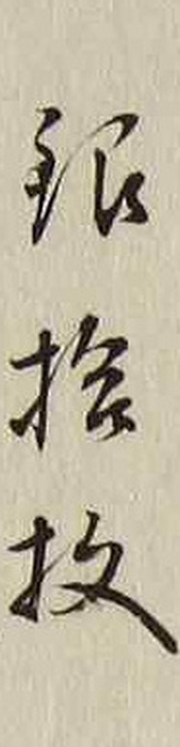銀拾枚
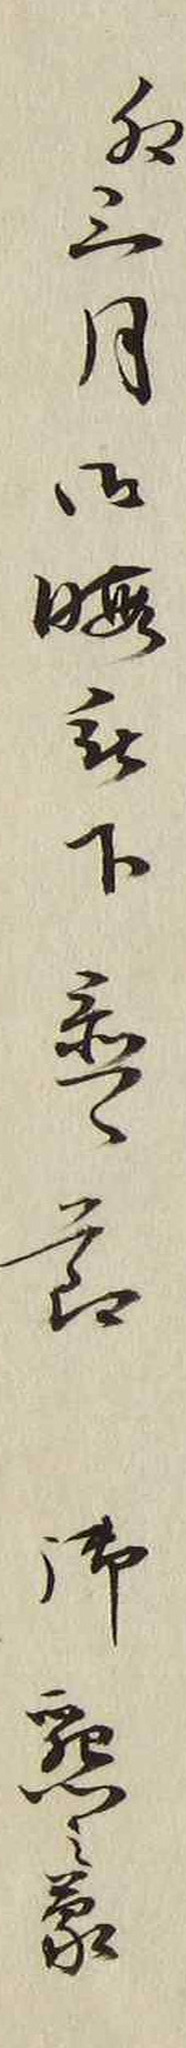卯三月御暇下し置かれ候節御懇ろ
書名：諸士系譜　巻之16　い之部16
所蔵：会津若松市立会津図書館
